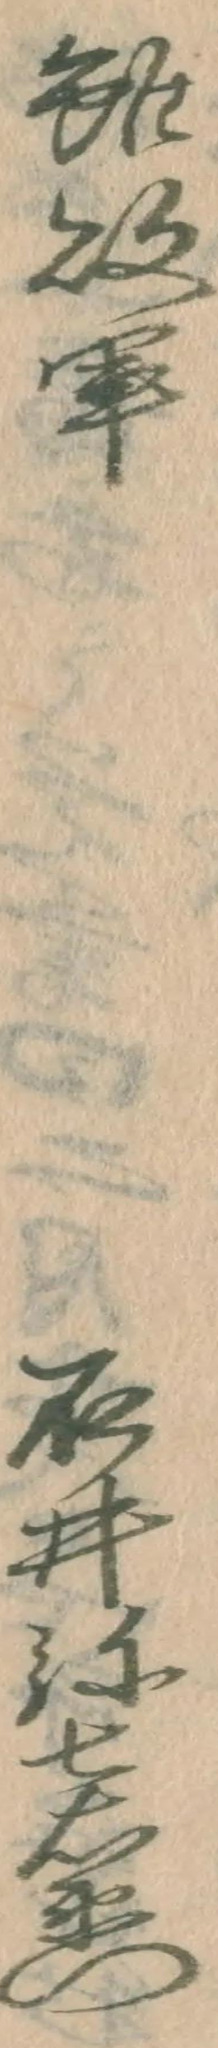雖敗軍石井弥七右衛門

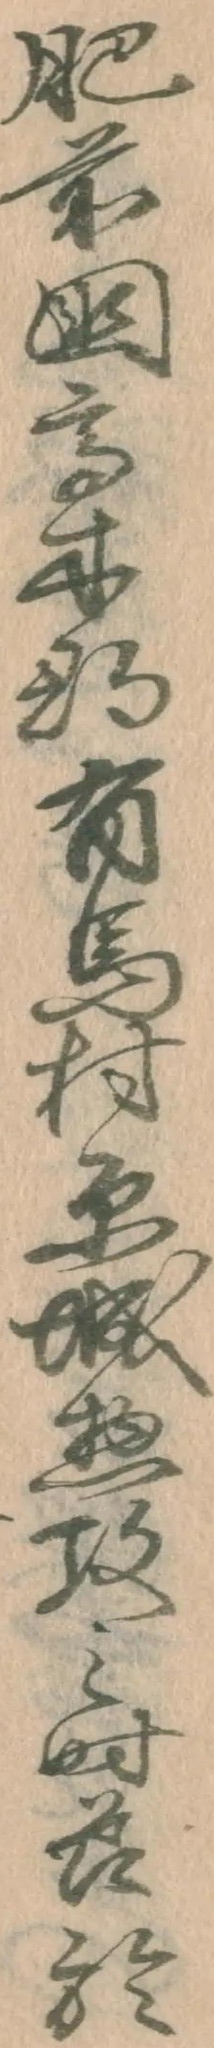肥前国高木郡有馬村原城惣攻之時節於
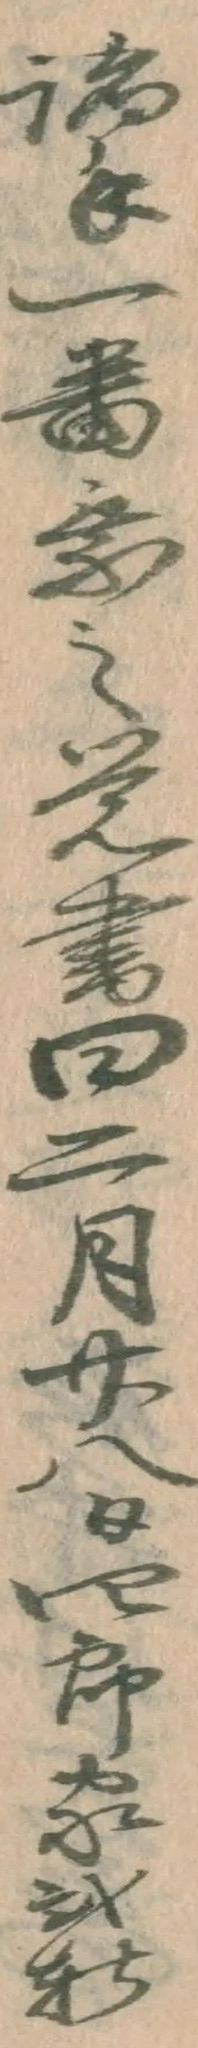諸手一番乗之覚書曰二月廿八日四郎家に弐軒
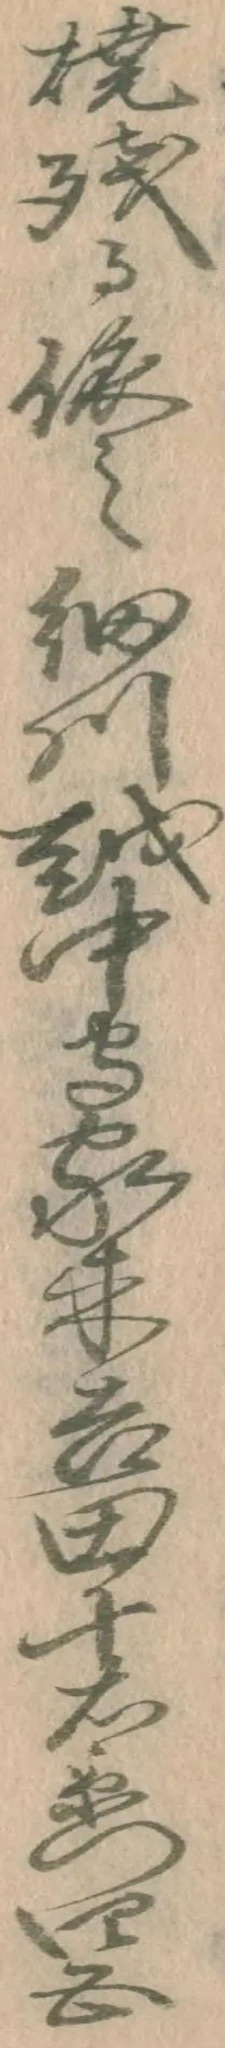焼残る依之細川越中守家来吉田十右衛門四五
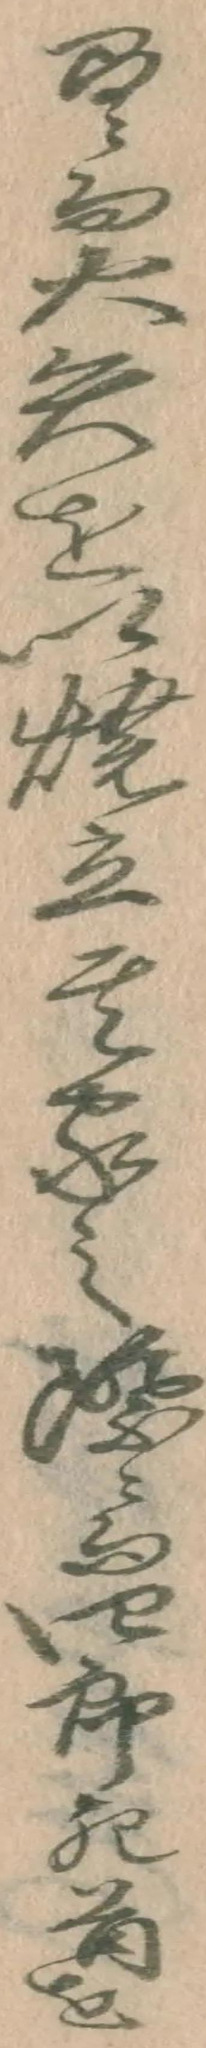間に而火矢を以焼立其家之際に而四郎歟首を
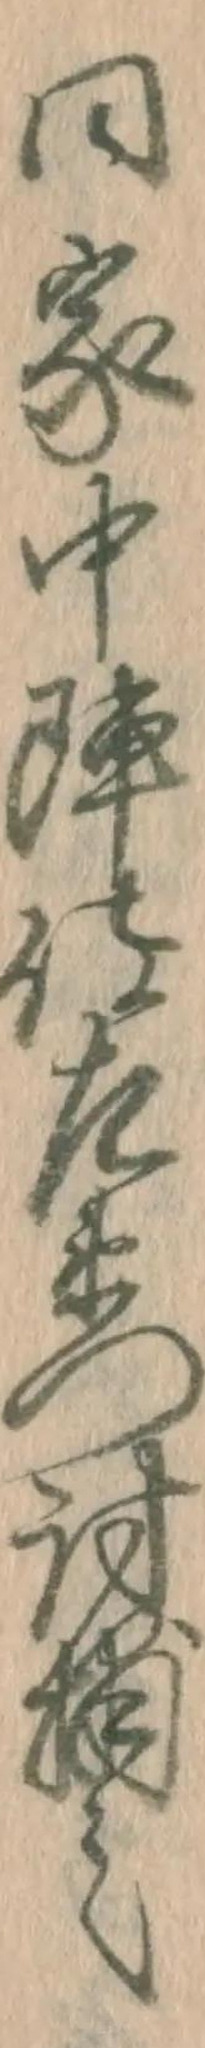同家中陣佐左衛門討捕之
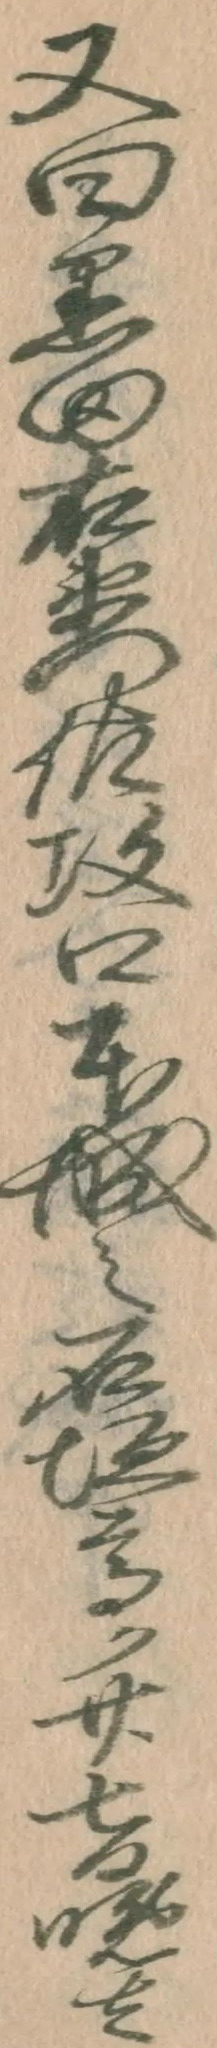又曰黒田右衛門佐攻口本城之石垣高く廿七日晩者
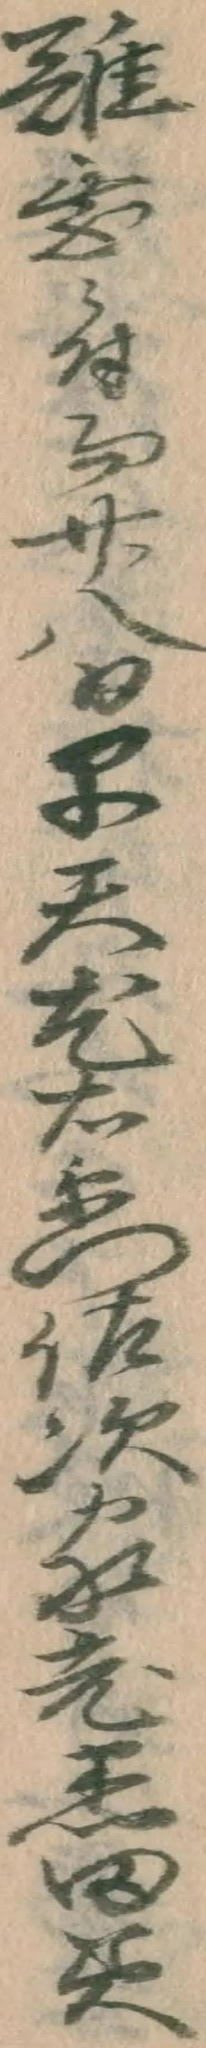難乗に付而廿八日早天尤右衛門佐次家老黒田美
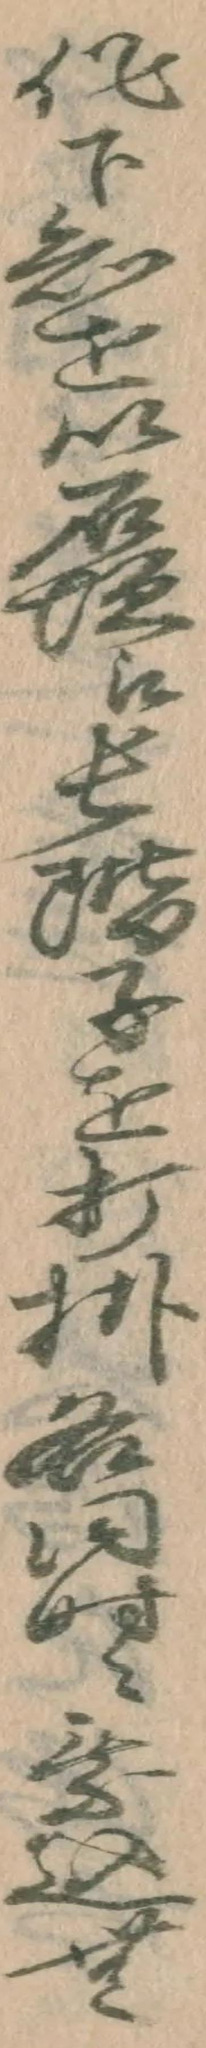作下知を以石垣江長階子を打掛各同時に乗込無
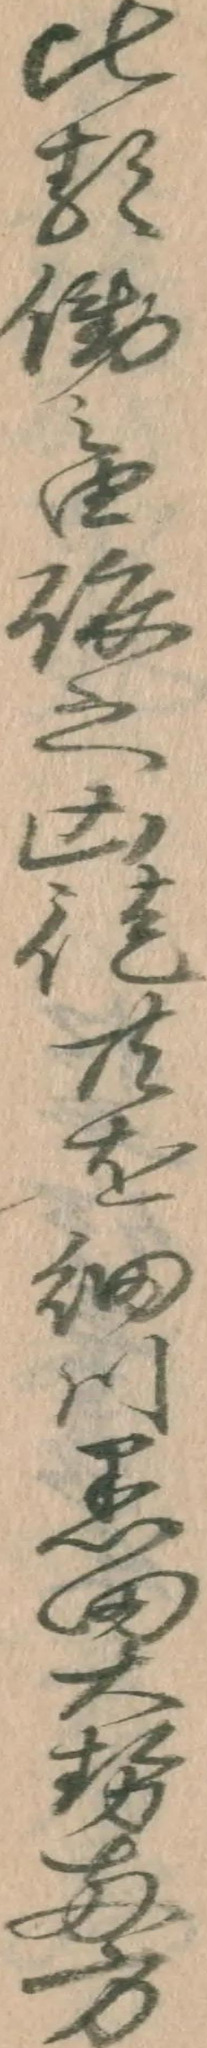比類働之由依之凶徒共を細川黒田大勢両方
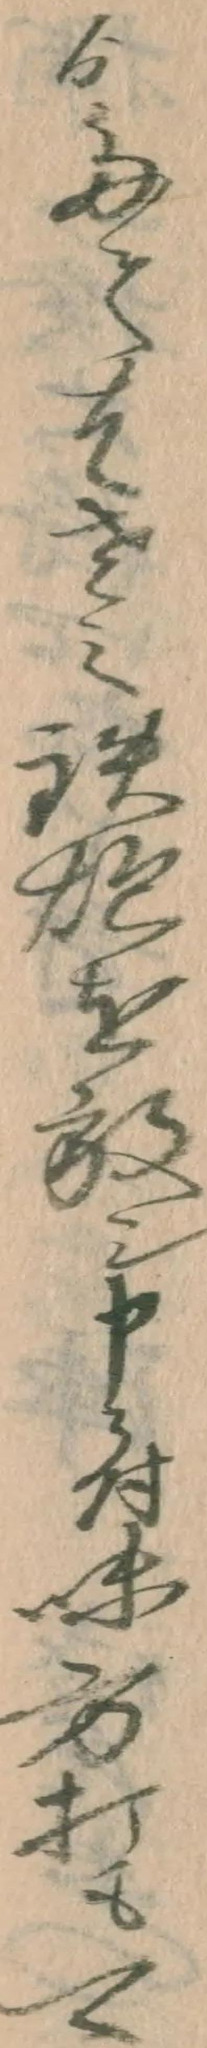ゟ多て者さみ鉄砲を放し申に付味方打も可
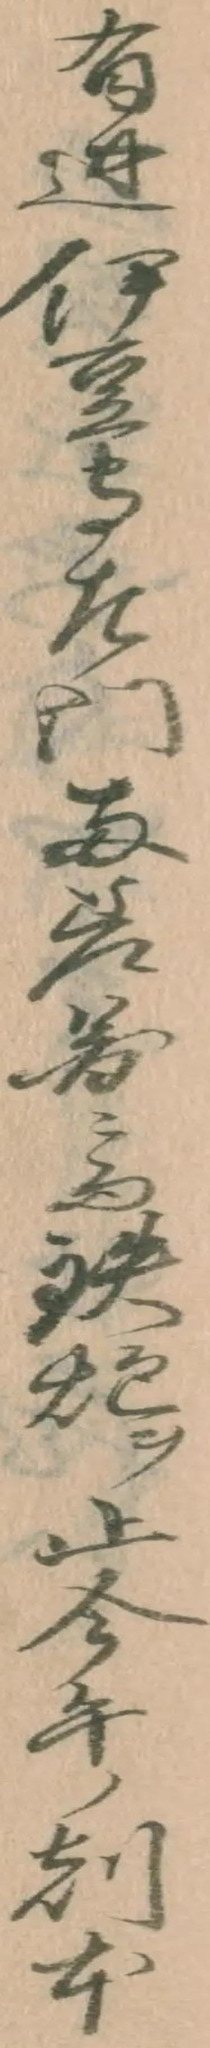有迚伊豆守左門両差図に而鉄砲を止今午之刻本
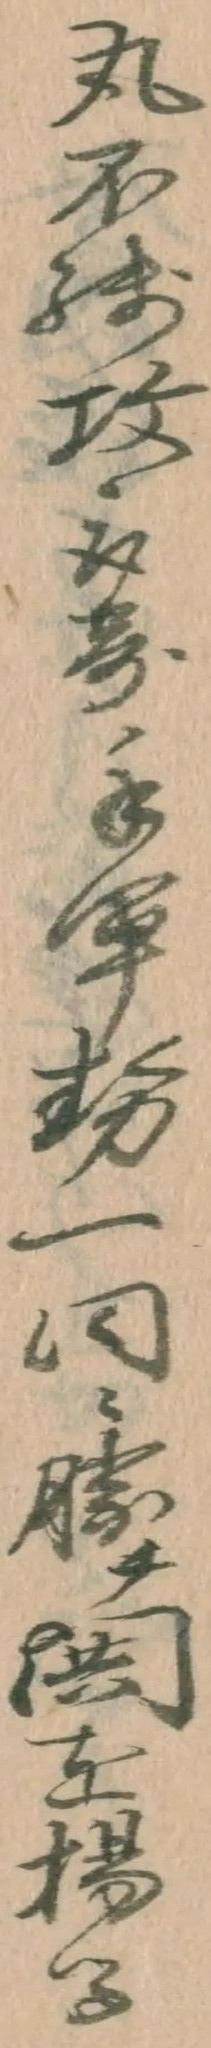丸不残攻取寄手軍勢一同に勝ち鬨を揚る
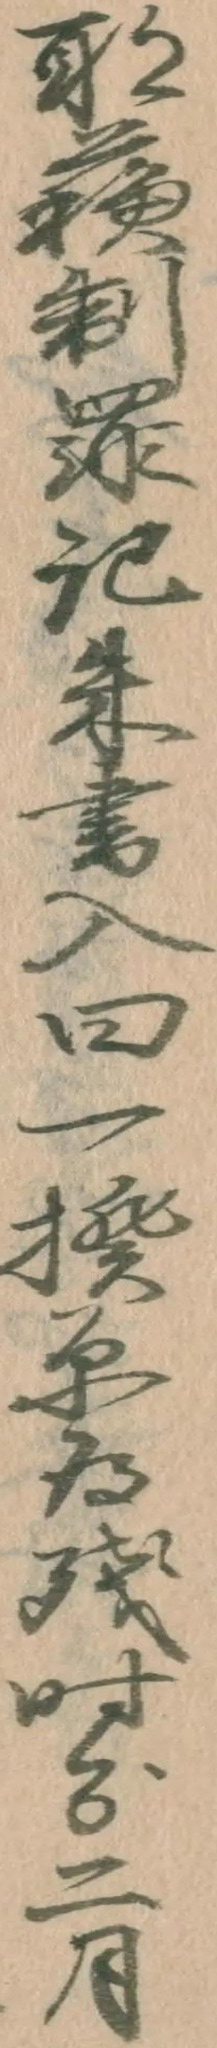耶蘇制罪記朱書入曰一揆原為残時分二月
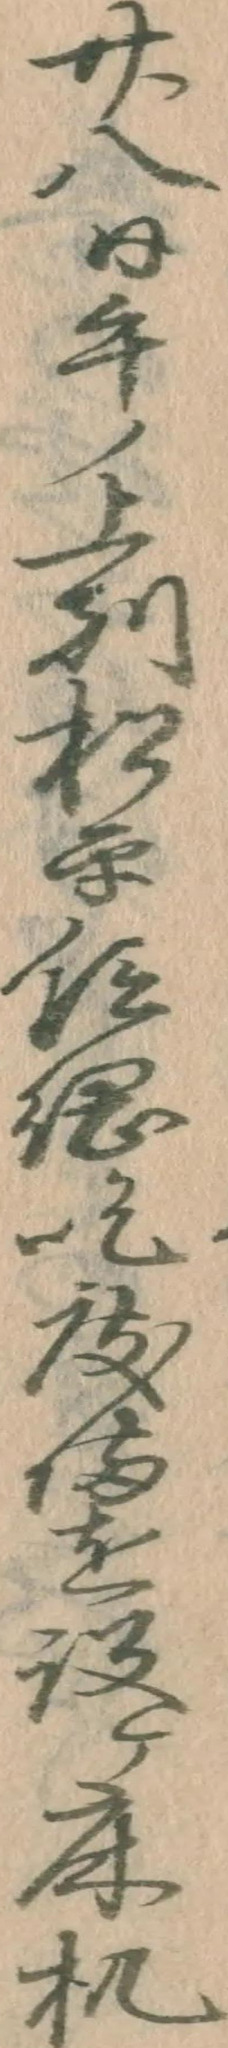廿八日午之上刻松平信綱屹度備を設け床机
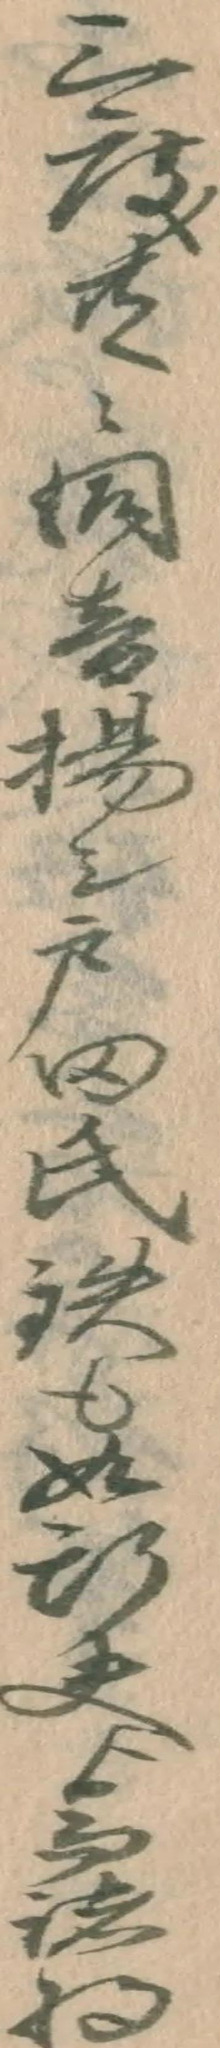三度共に同音揚し戸田氏鉄も如斯夫ゟ而諸将
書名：切支丹御退治記 49巻. [8]
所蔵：国立国会図書館 National Diet Library, JAPAN
